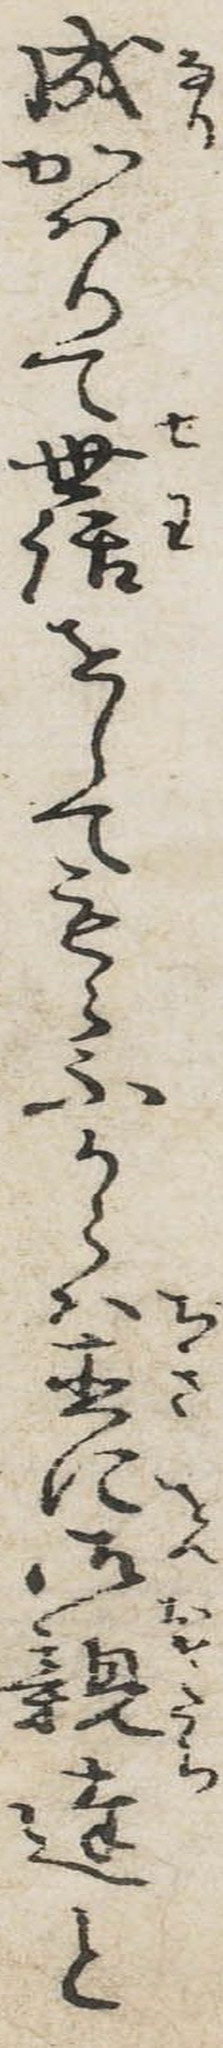成かはりて世話をしてもらふからは直に御親達と
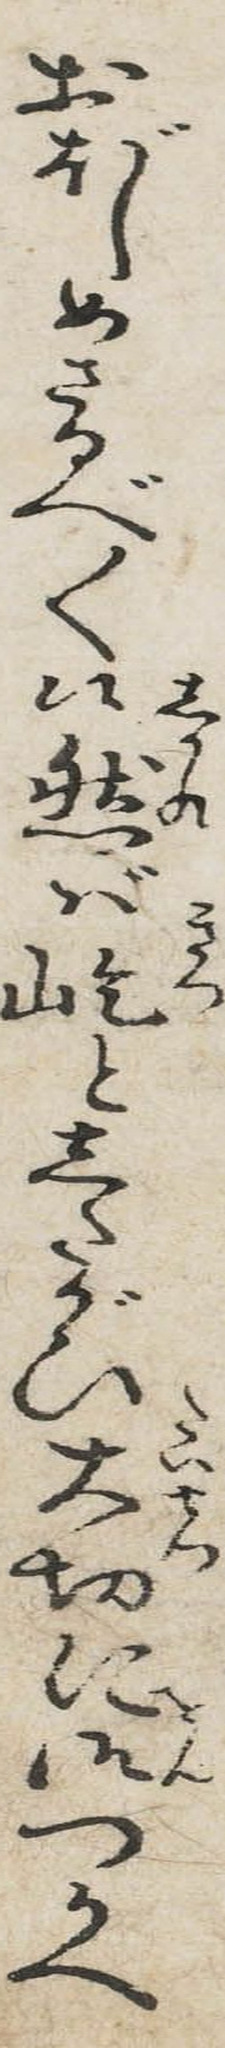おぼしめさるべく候然ば屹としたがひ大切に御つかへ
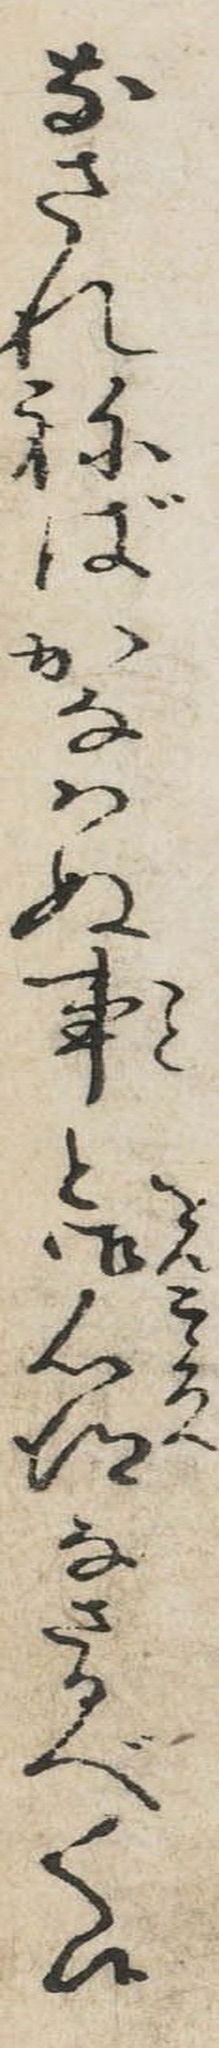なされねばかなはぬ事と御心得なさるべく候

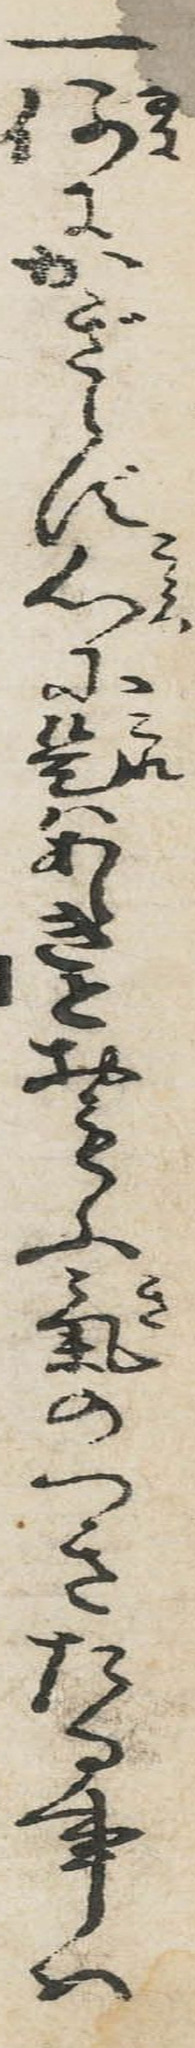一何にかぎらず心に是はあしきとおもふ気のつきたる事は
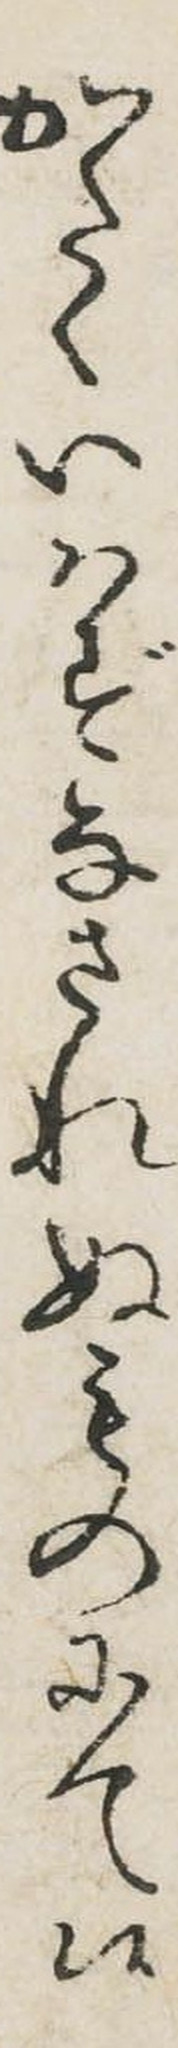かたくいはずなされぬものにて候
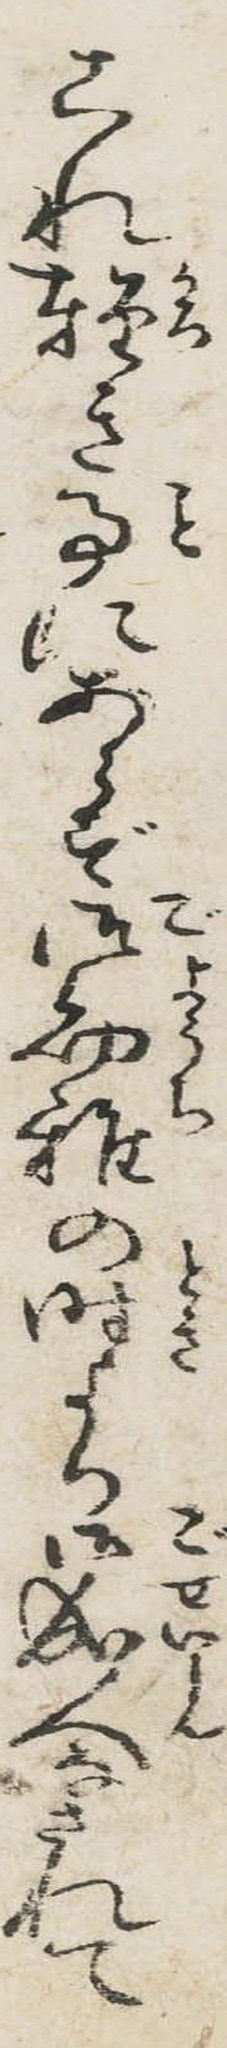これ軽き事にあらず御幼稚の時より御成人なされて
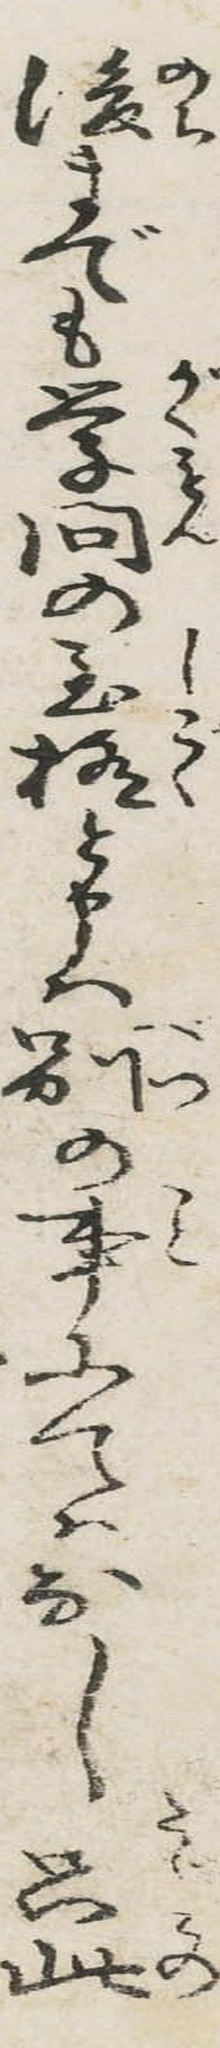後までも学問の至極と申は別の事にてはなし只此
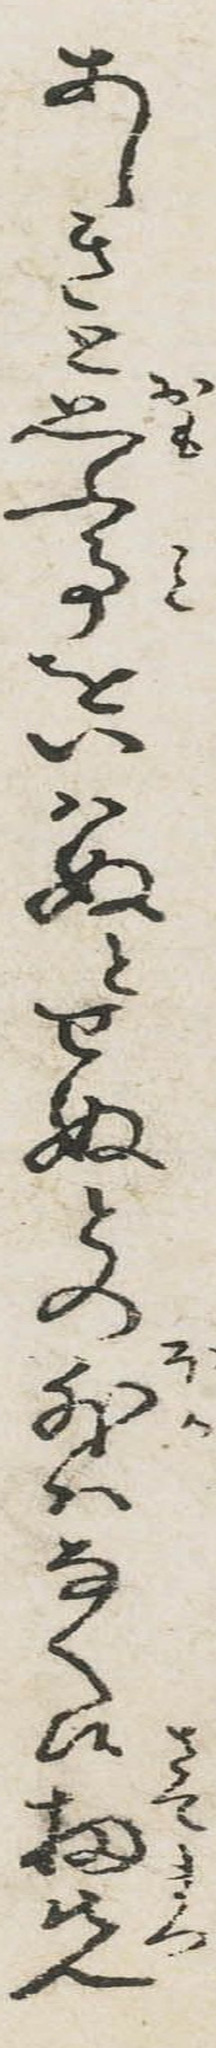あしきと思ふ事をいはぬとせぬとの外はなく候扨先
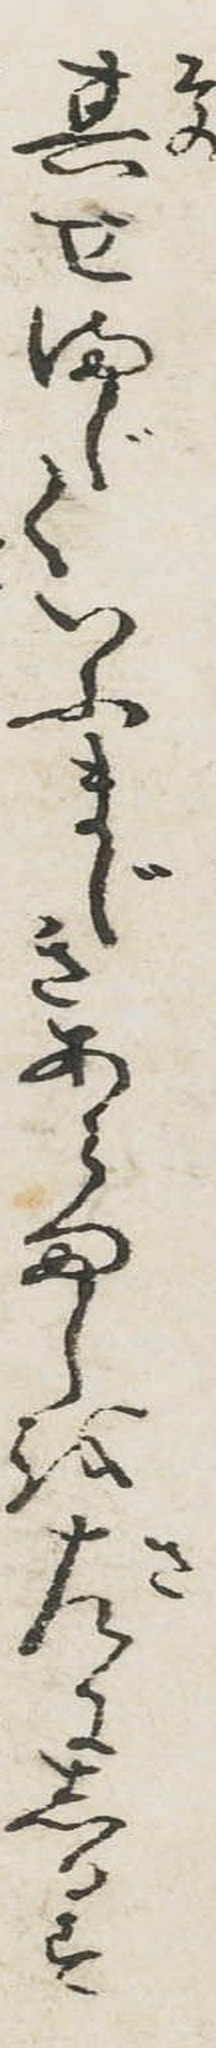其せまじくいふまじきあらましを左にしるす
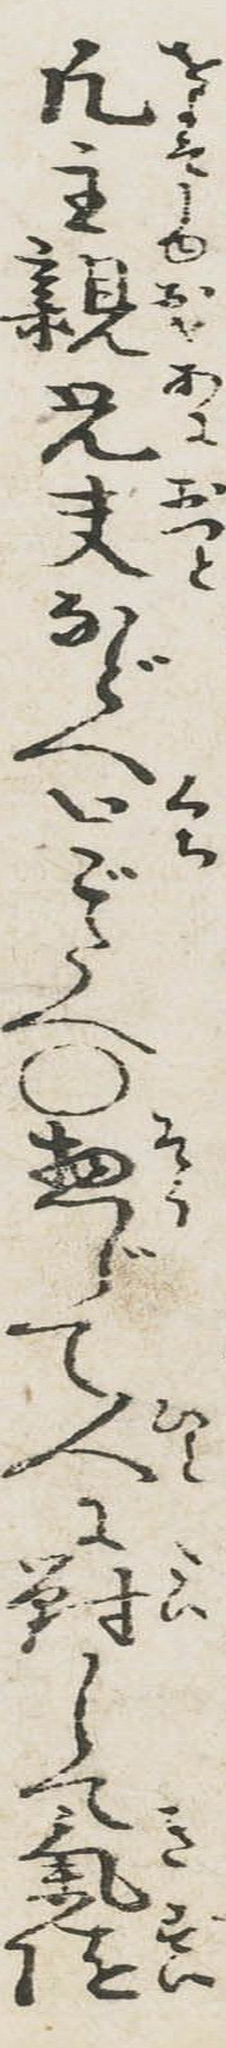凡主親兄夫などへ口ごたへ○惣じて人に対して気随
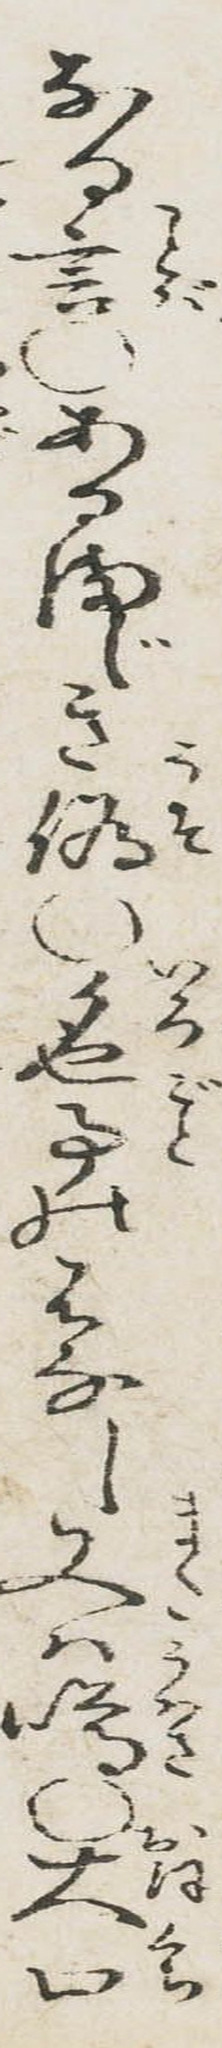なる言○あるまじき偽○色事のはなし又は噂○大口
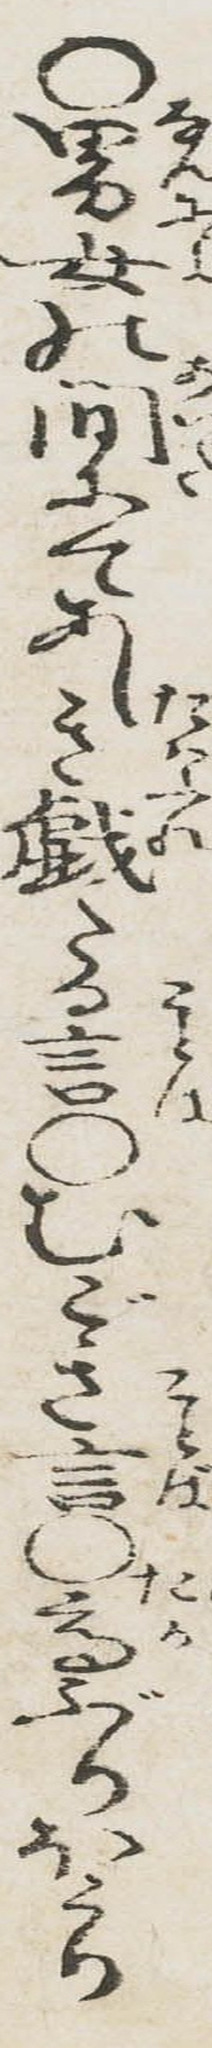○男女の間にてあしき戯たる言○むごき言○高ぶりほこり
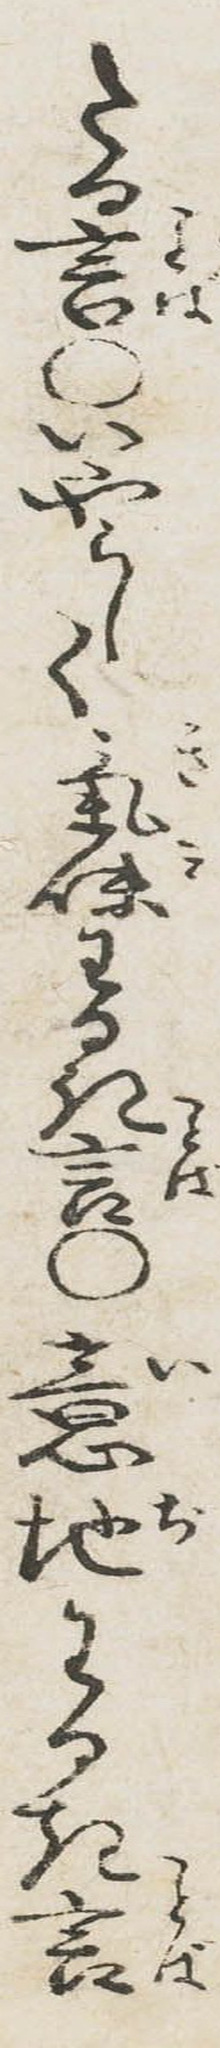たる言○いやらしく気味わるき言○意地わるき言
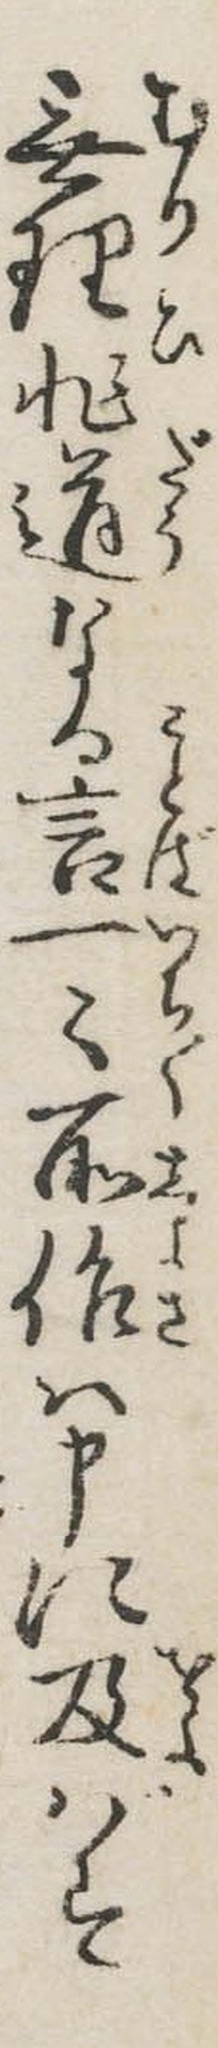無理非道なる言一々所作は申に及ばす
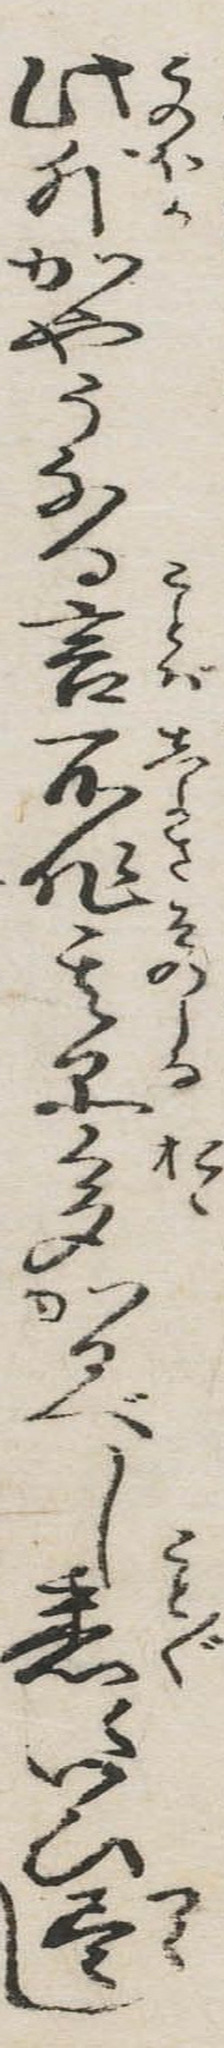此外かやうなる言所作其品多かるべし悉くいひ尽し
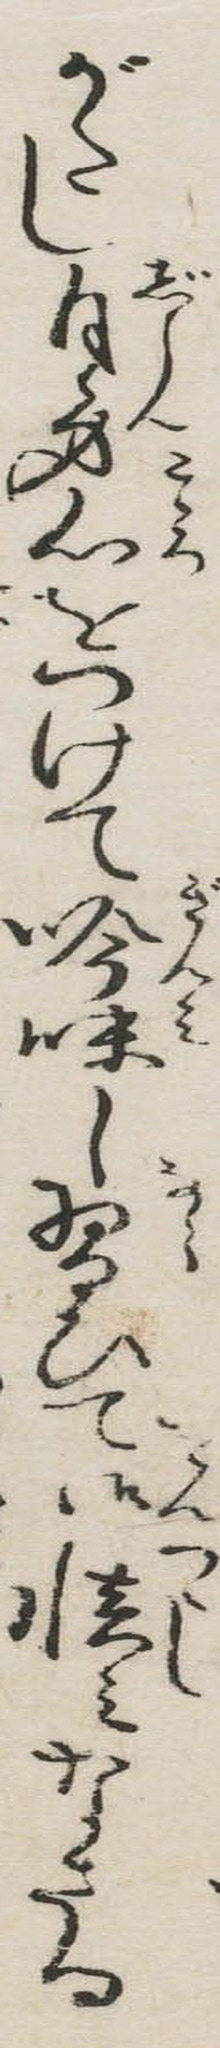がたし自身心をつけて吟味し習ひて御慎みなさる
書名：前訓
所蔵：東京学芸大学附属図書館
